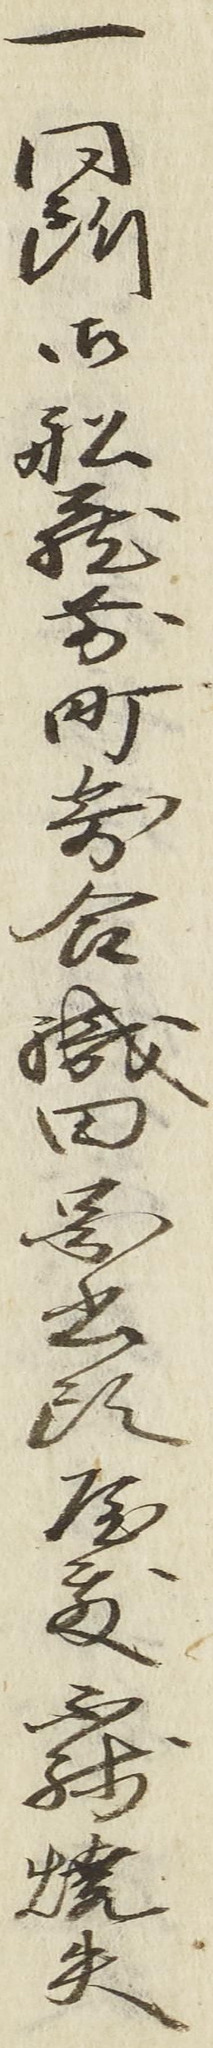一同所御船蔵前町寄合織田図書頭屋敷不残焼失
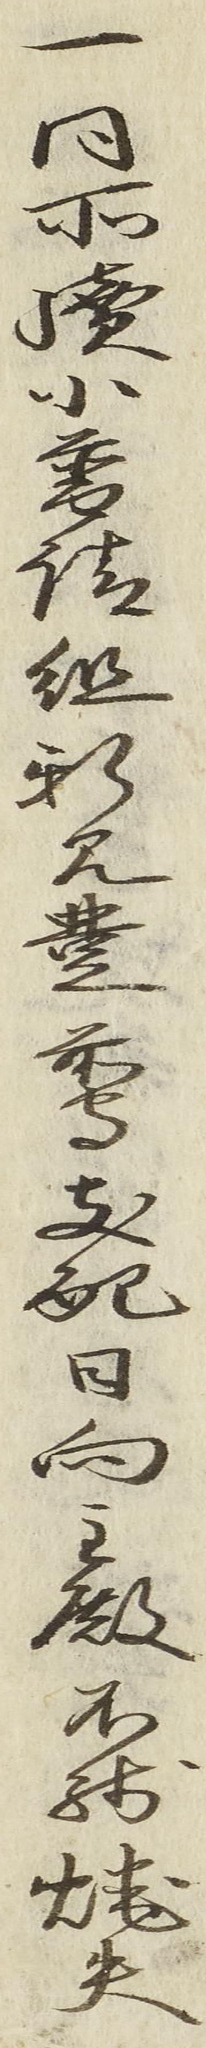一同所続小普請組新見豊前守支配日向主殿不残焼失

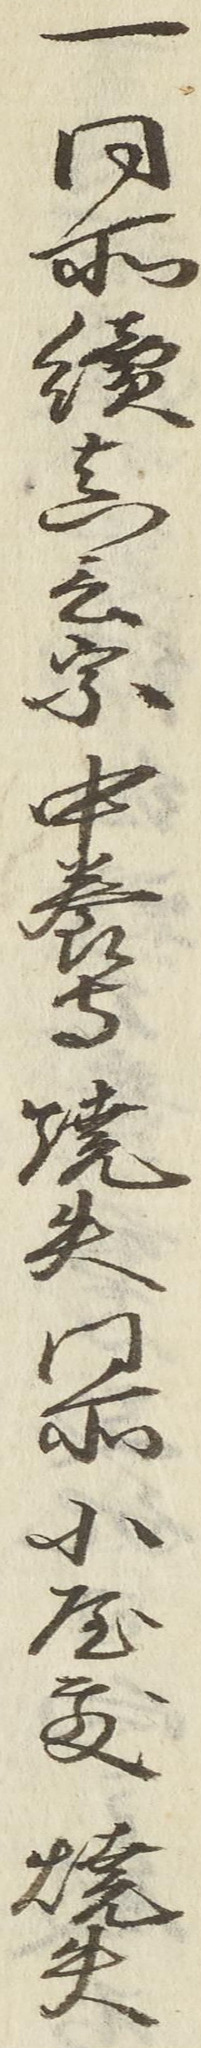一同所続真言宗中養寺焼失同所小屋敷焼失
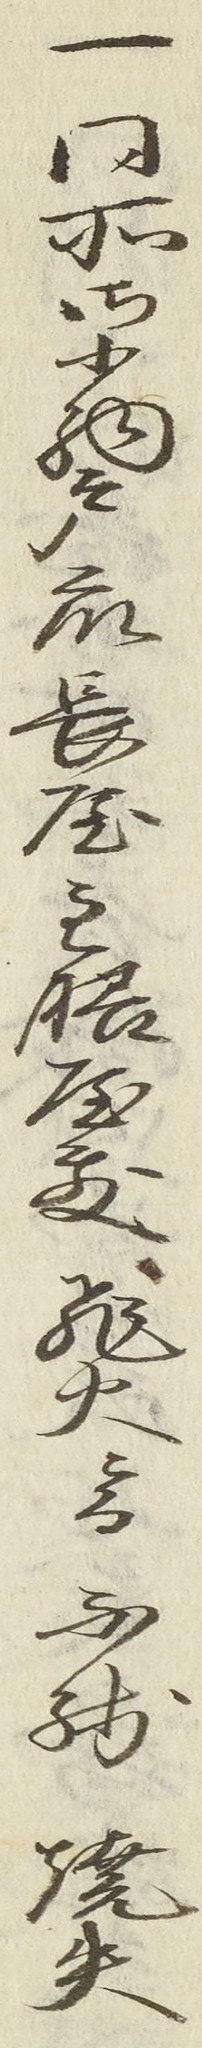一同所御小納戸衆長屋主膳屋敷飛火にて不残焼失
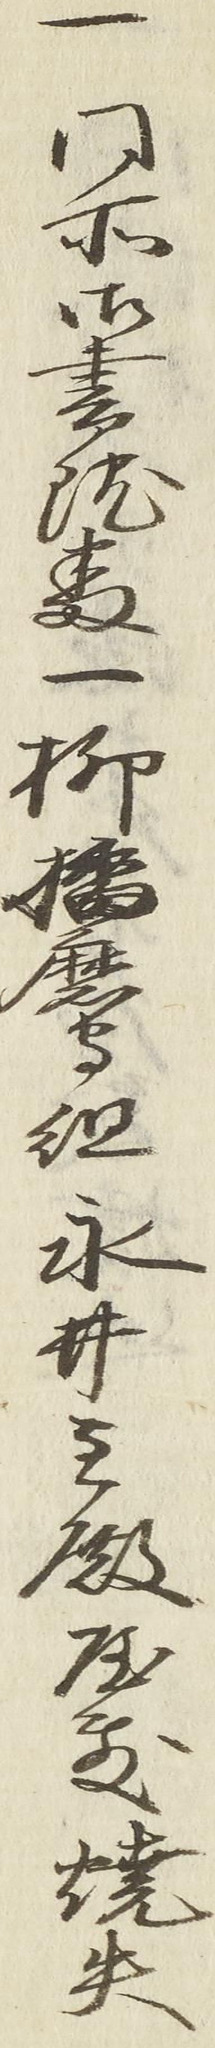一同所御書院番一柳播磨守組永井主殿屋敷焼失
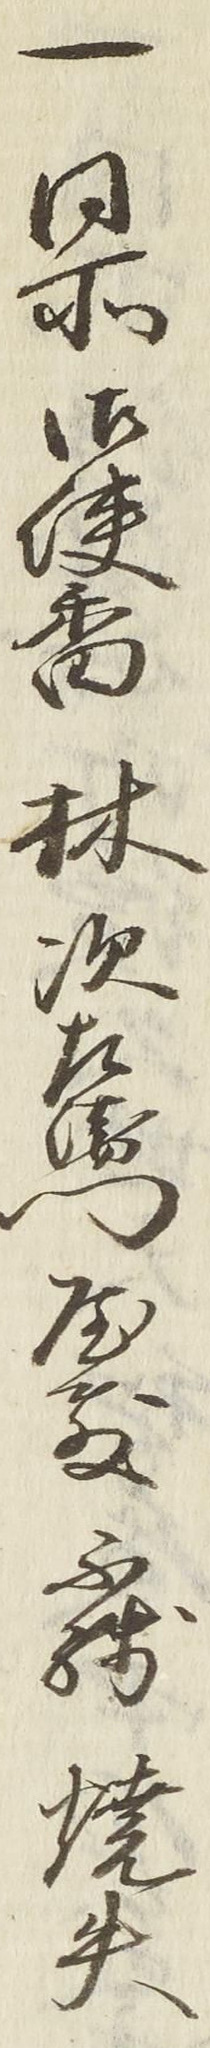一同所御使番林次左衛門屋敷不残焼失
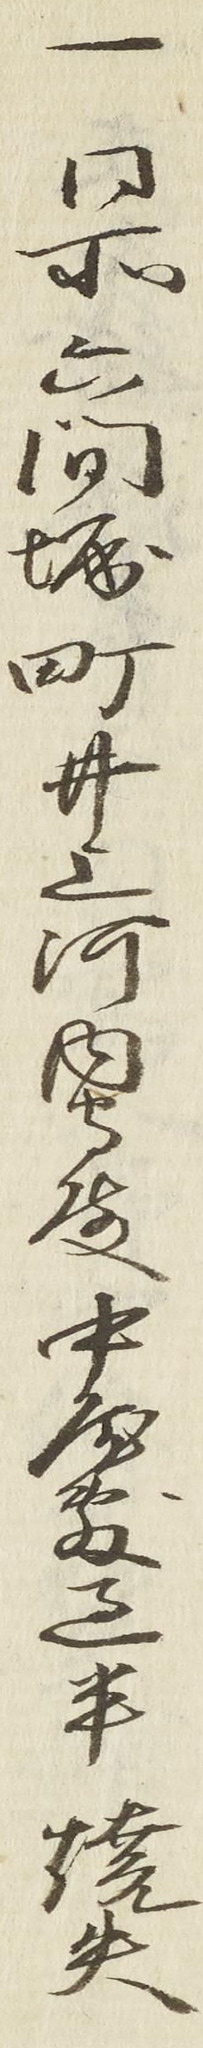一同所六間堀町井上河内守殿中屋敷過半焼失
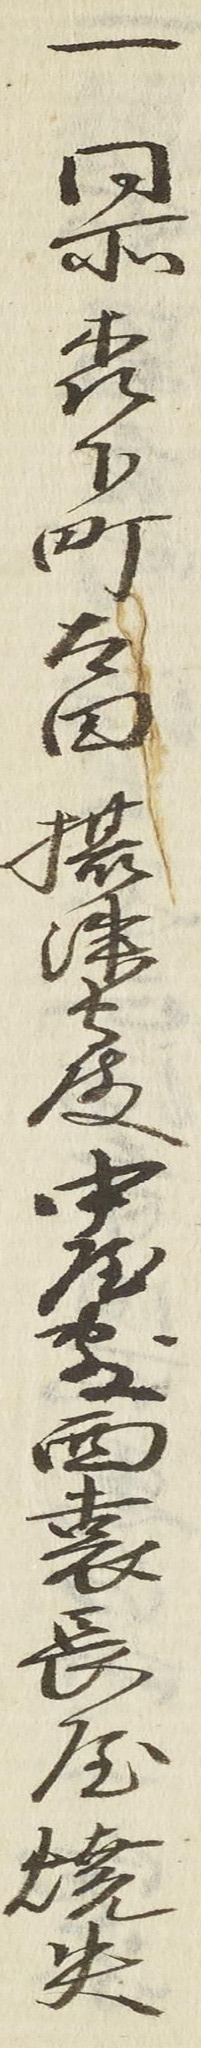一同所森下町太田摂津守殿中屋敷西裏長屋焼失
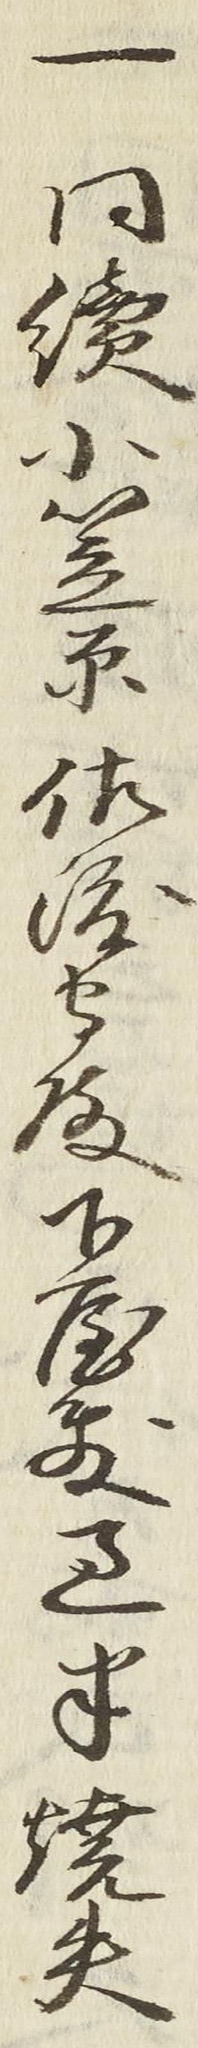一同続小笠原佐渡守殿下屋敷過半焼失
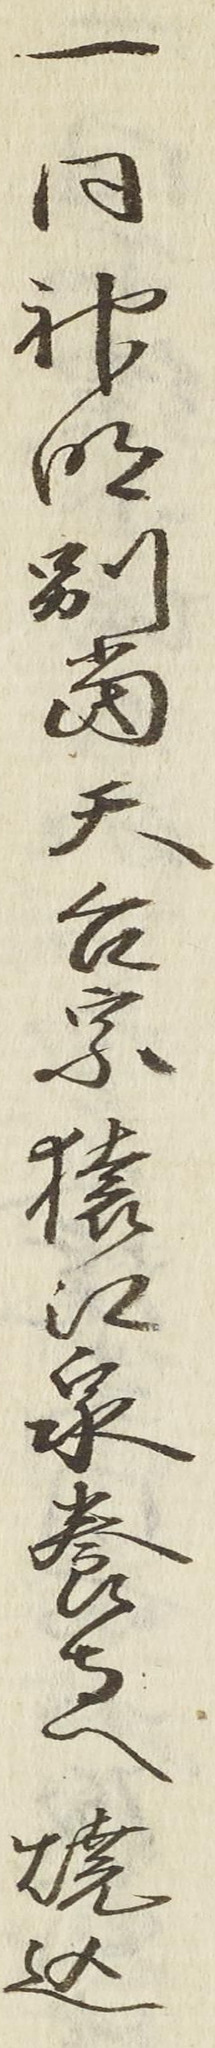一同神明別当天台宗猿江泉養寺へ焼込
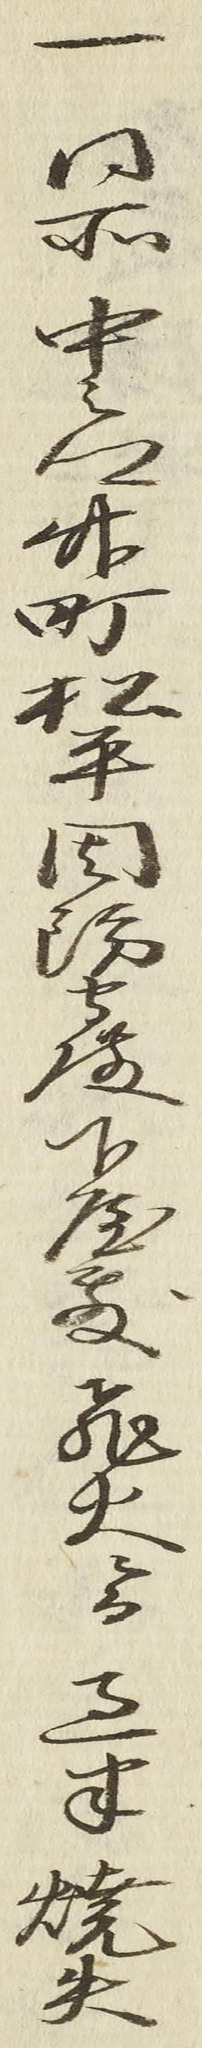一同所中之郷竹町松平周防守殿下屋敷飛火にて過半焼失
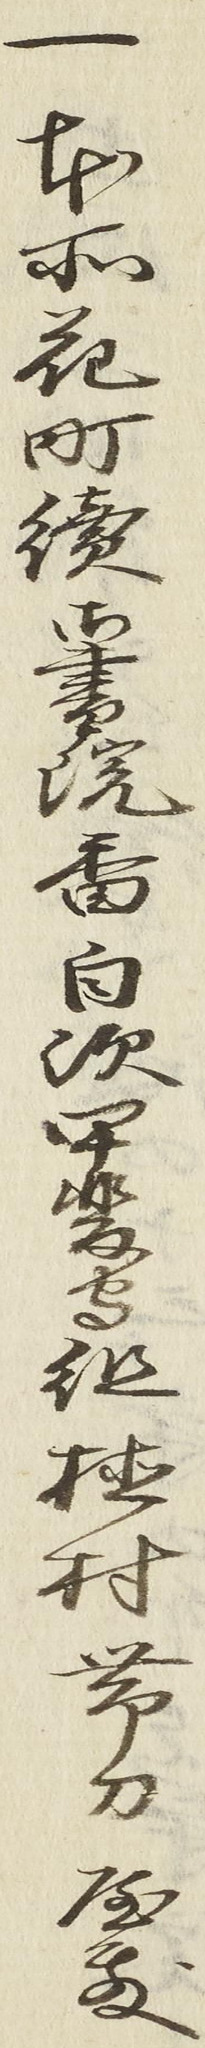一本所花町続御書院番白須甲斐守組植村帯刀屋敷
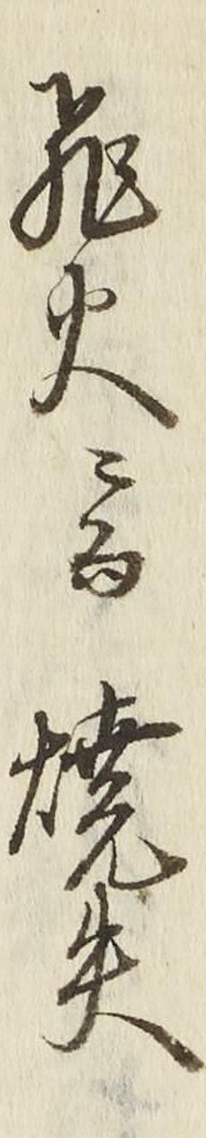飛火にて焼失
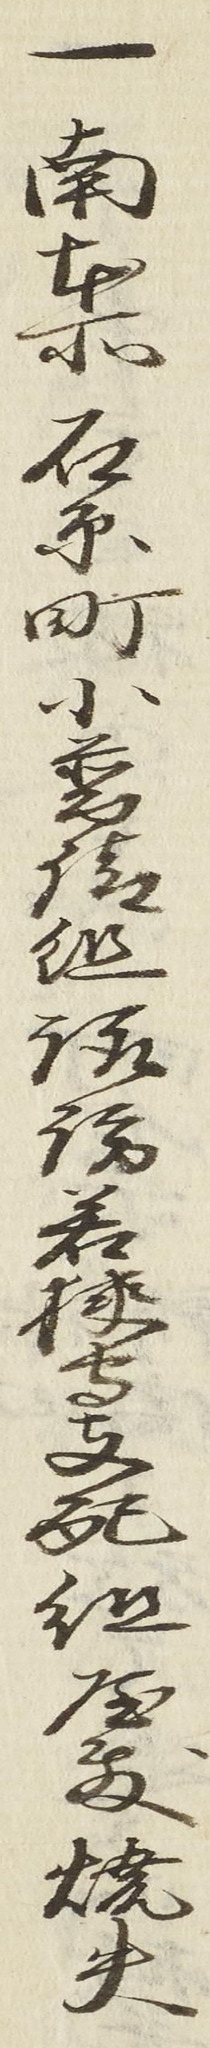一南本所石原町小普請組諏訪若狭守支配組屋敷焼失
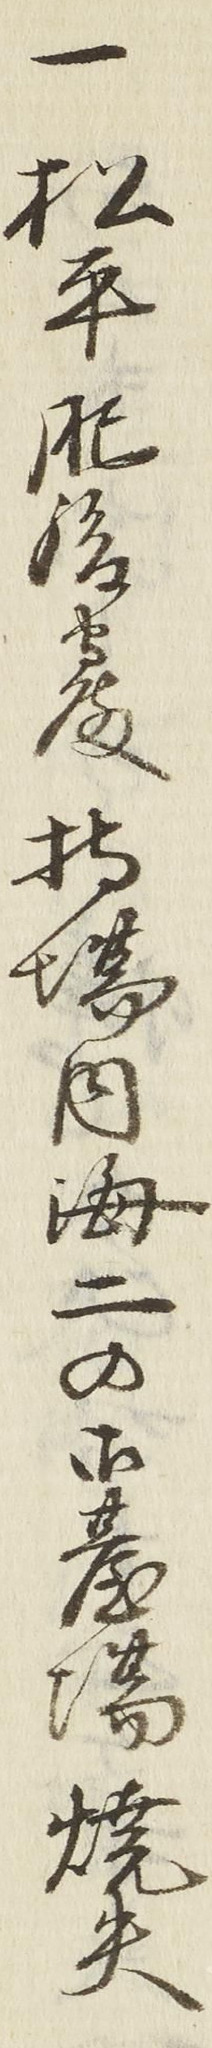一松平肥後守殿持場内海二の御台場焼失
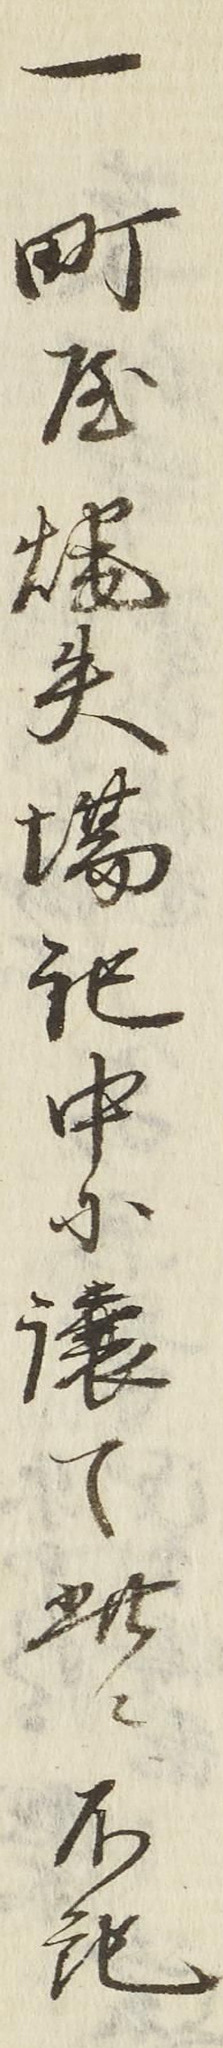一町家焼失場記中に譲て此に不記
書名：やぶれ窓の記　全
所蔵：東京大学地震研究所図書室 Earthquake Research Institute Library, The University of Tokyo, JAPAN
